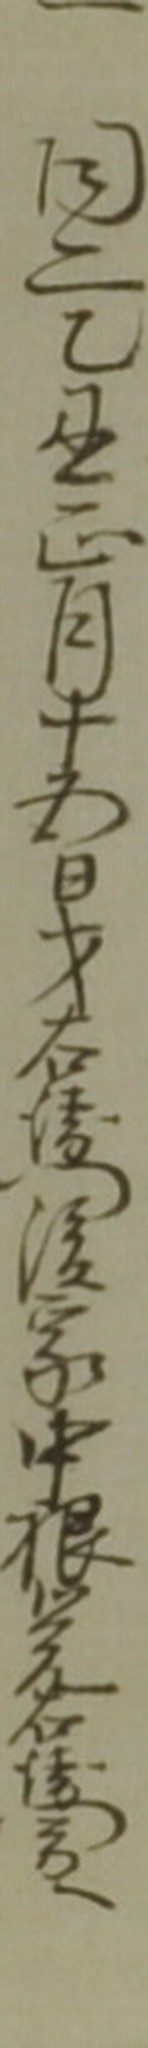一同二乙丑正月十五日才右衛門後家中根藤右衛門方
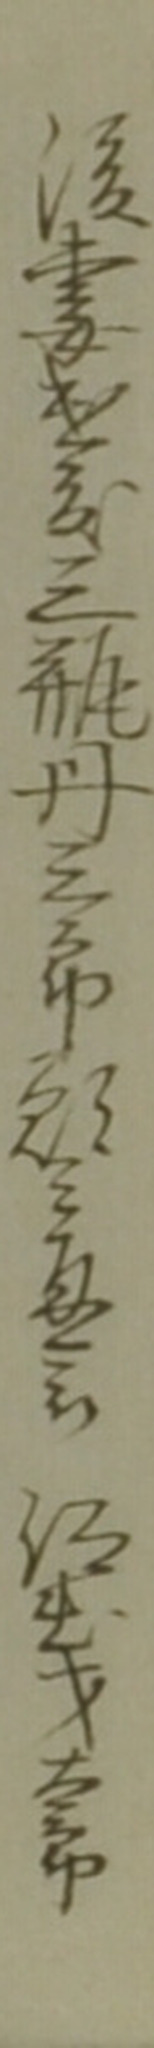後妻遣度三瓶丹三郎願之通被仰出才太郎

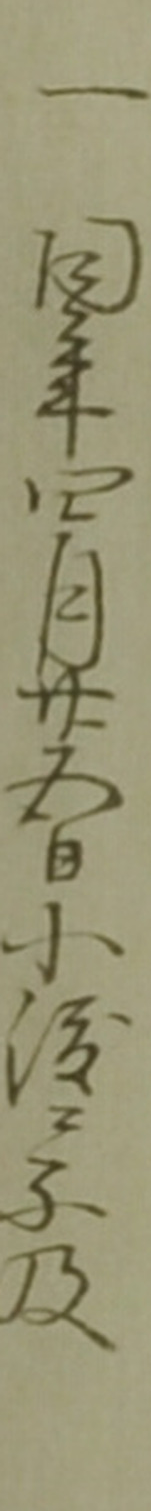一同年四月廿五日小渡不及
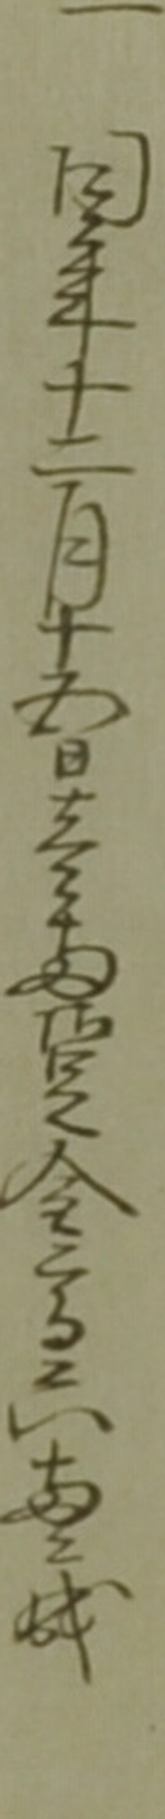一同年十二月十五日壱両御足金高六両成
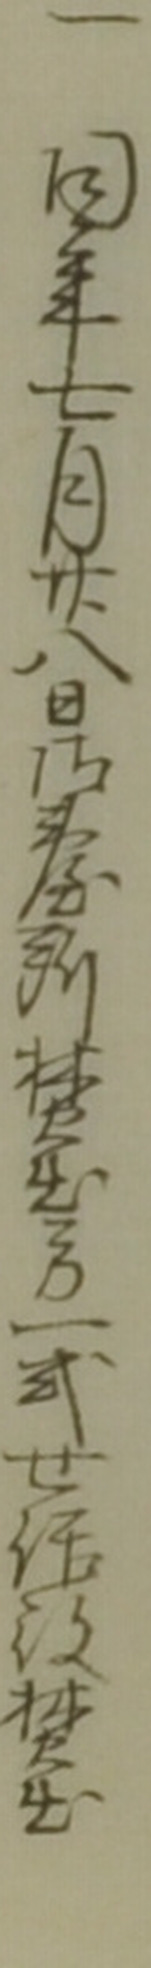一同年七月廿八日御台所焚出方一式世話役焚出
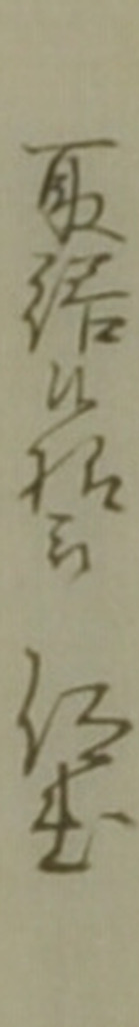取繕候様被仰出
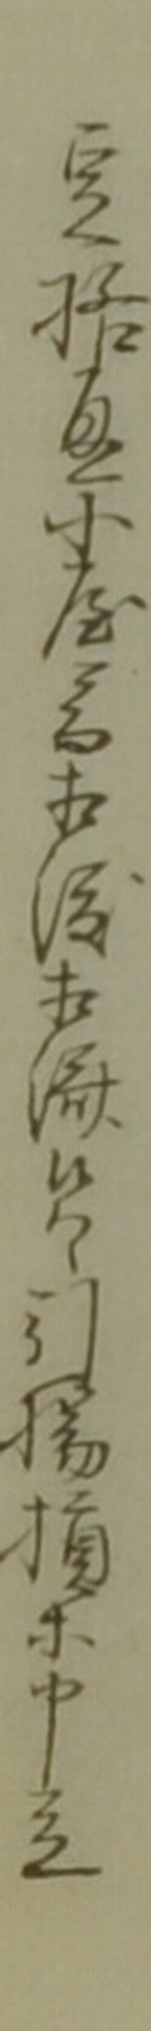定格通小屋ニ而相渡相済候ハゝ引揚損等申立
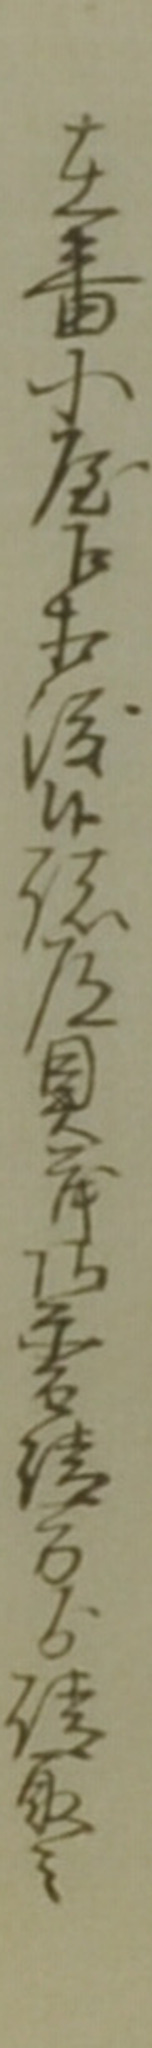在番小屋江相渡候諸道具茂御普請方ゟ請取之
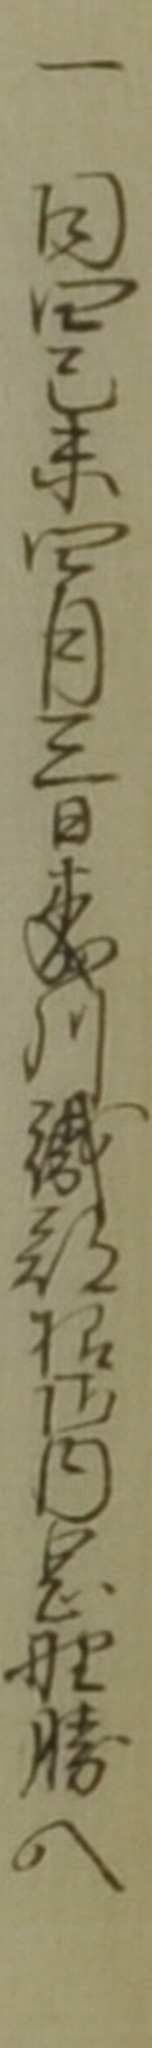一同四己未四月三日森川織部様御内岡野勝八
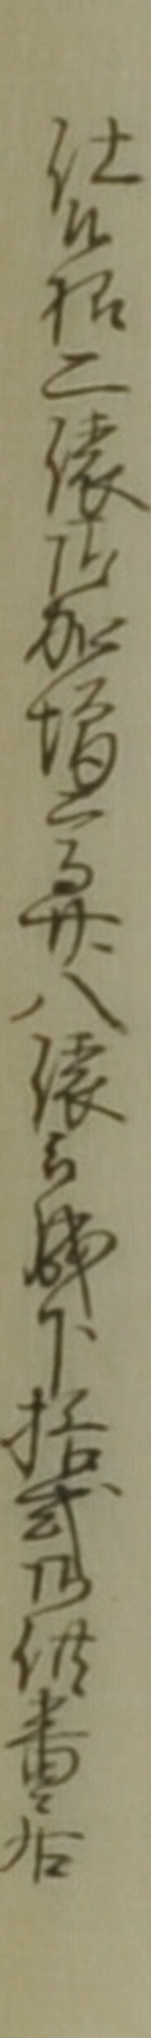仕候様二俵御加増高廿八俵被成下格式御供番居
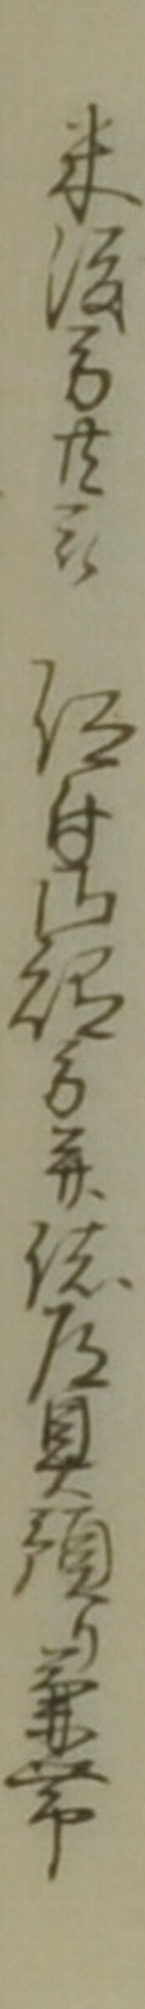米渡方共被仰付御賄方并諸道具預兼帯
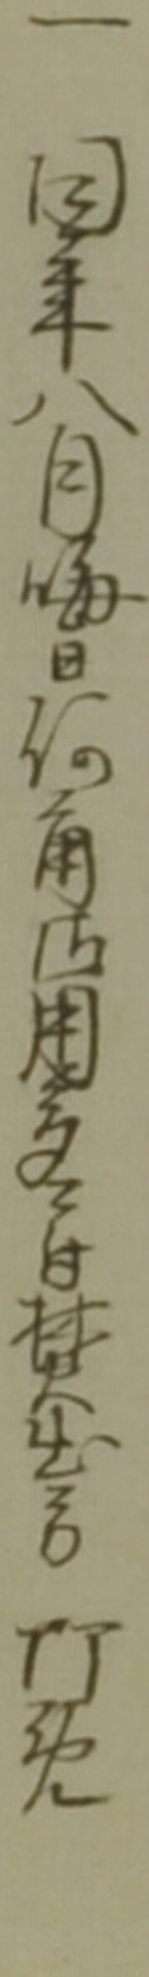一同年八月晦日何角御用多ニ付焚出方御免
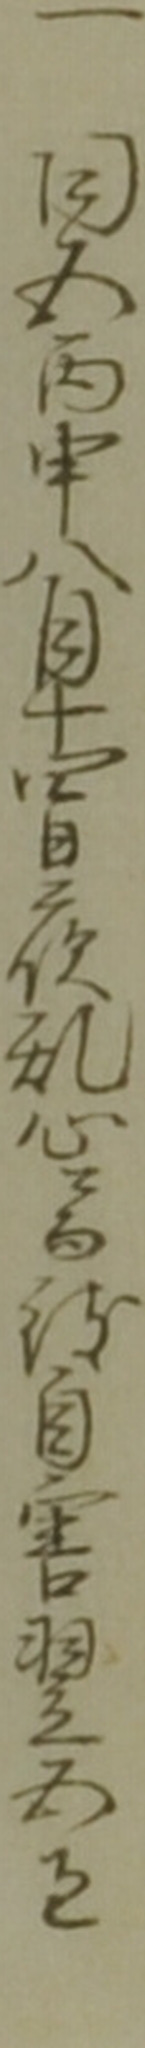一同五丙申八月十四日夜乱心而致自害翌五過
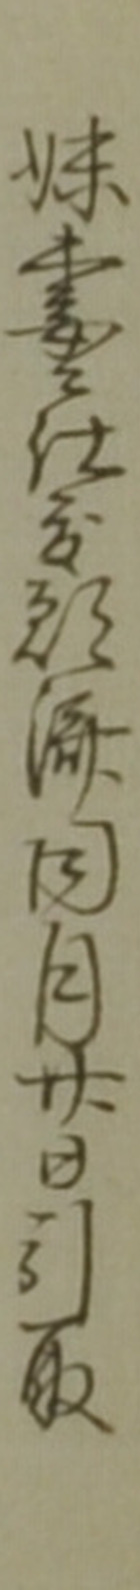妹妻仕度願済同月廿日引取
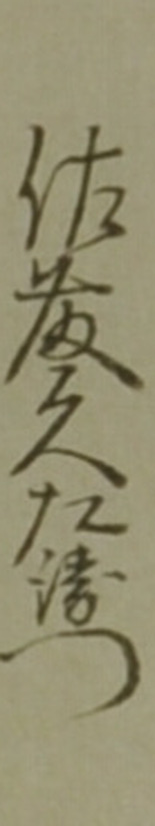佐藤久左衛門

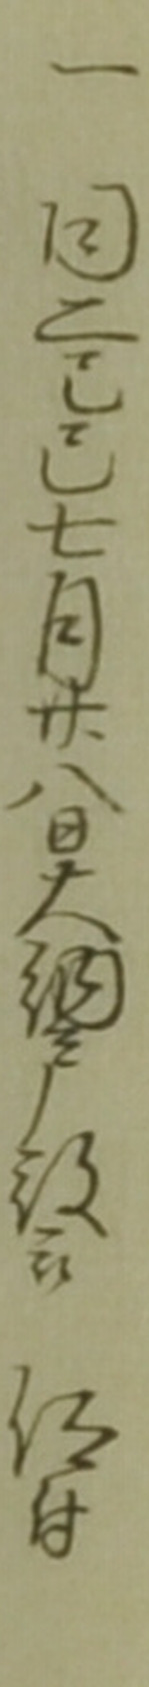一同二己巳七月廿八日大納戸役被仰付
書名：無足廃家（弐）
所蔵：伊那市立高遠町図書館・合同会社AMANE
